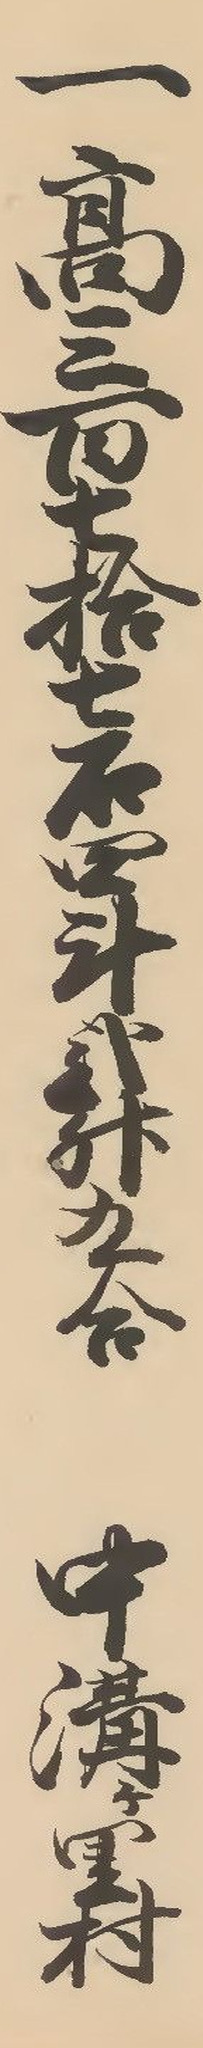一髙三百七拾七石四斗弐升九合中溝ケ里村
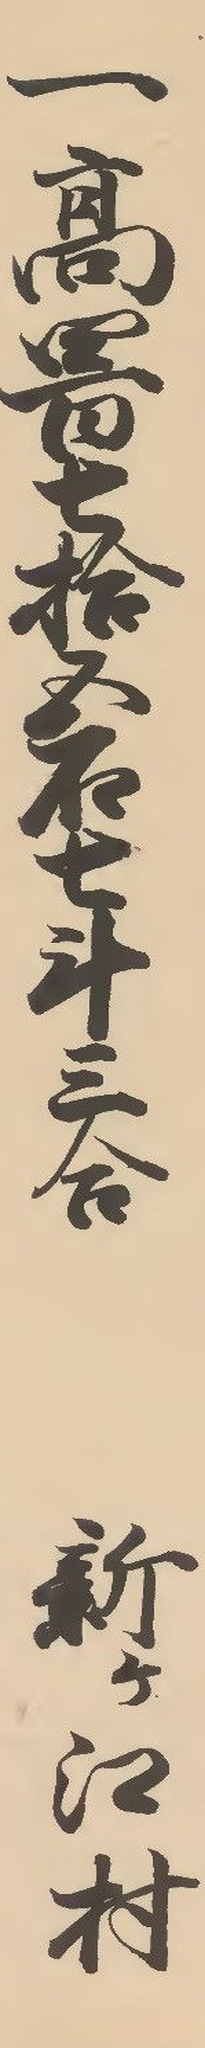一髙四百七拾五石七斗三合新ケ江村
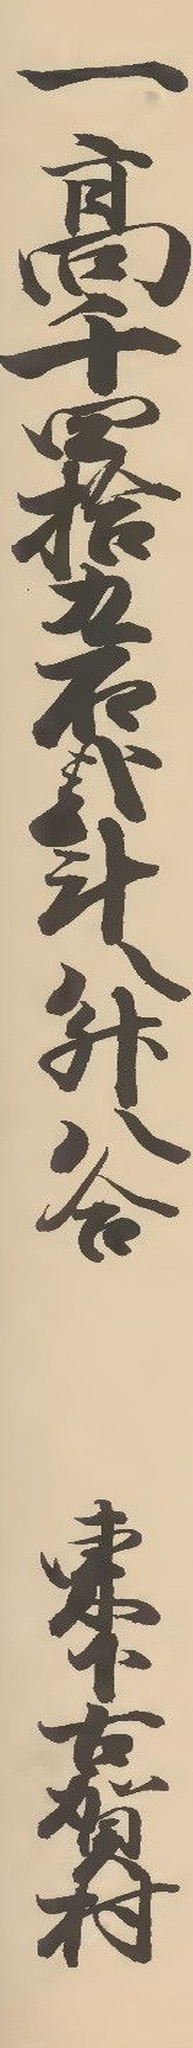一髙千四拾九石弐斗八升八合東下古賀村
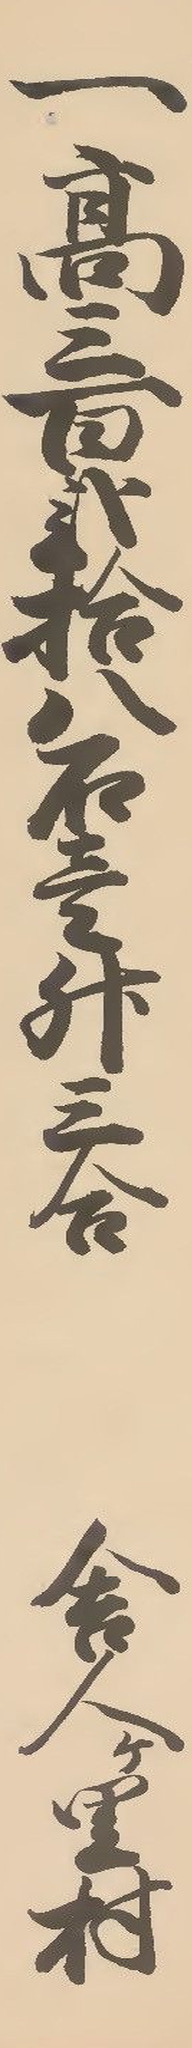一髙三百弐拾八石壱斗三合舎人ケ里村
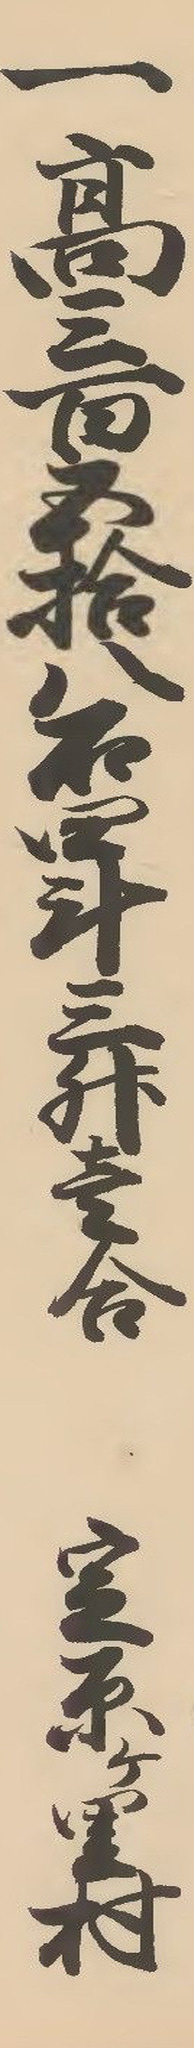一髙三百五拾八石四斗三升壱合定原ケ里村
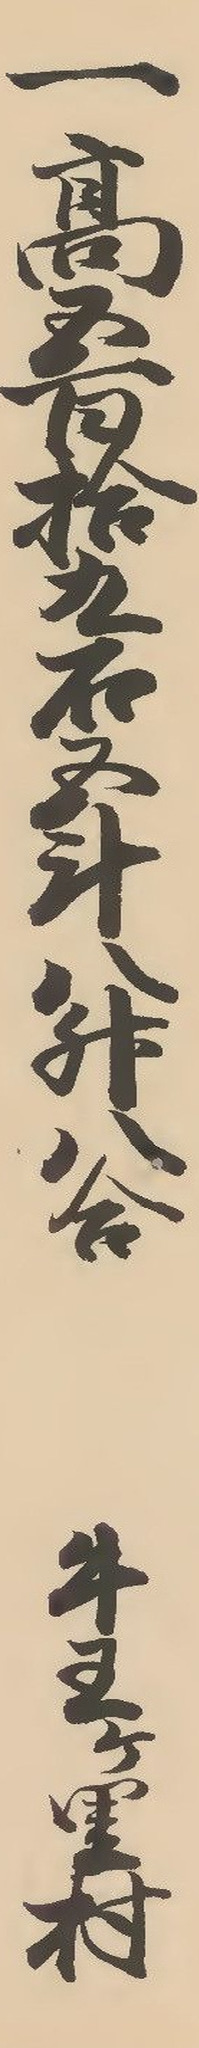一髙五百拾九石五斗八升八合牛王ケ里村
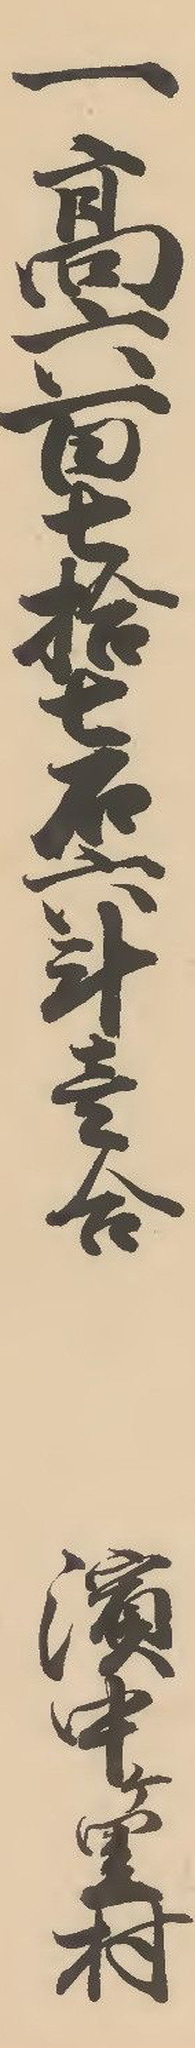一髙六百七拾七石六斗壱合濱中ケ里村

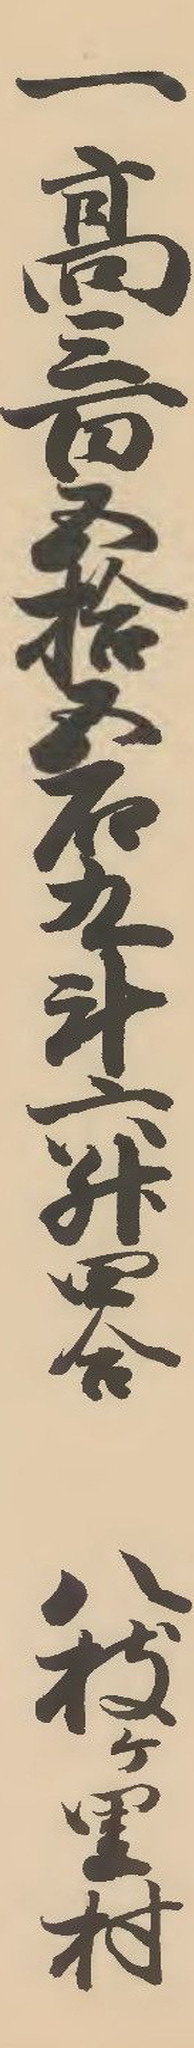一髙三百五拾五石九斗六升四合八枝ケ里村
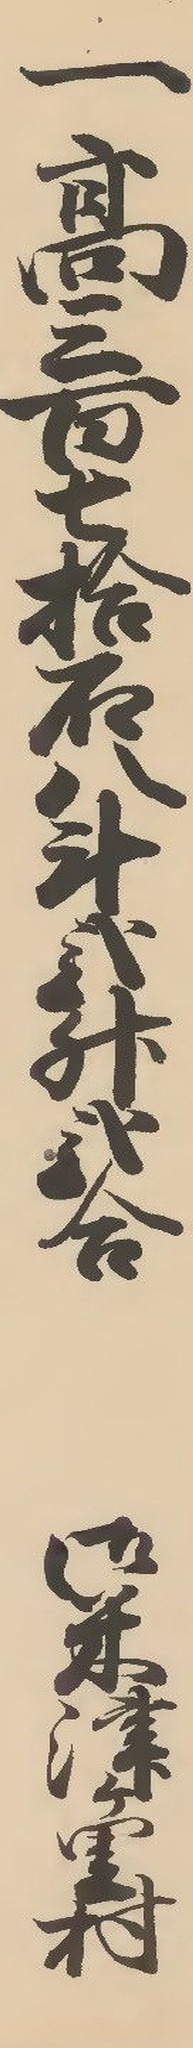一髙三百七拾石八斗弐升弐合御米津ケ里村
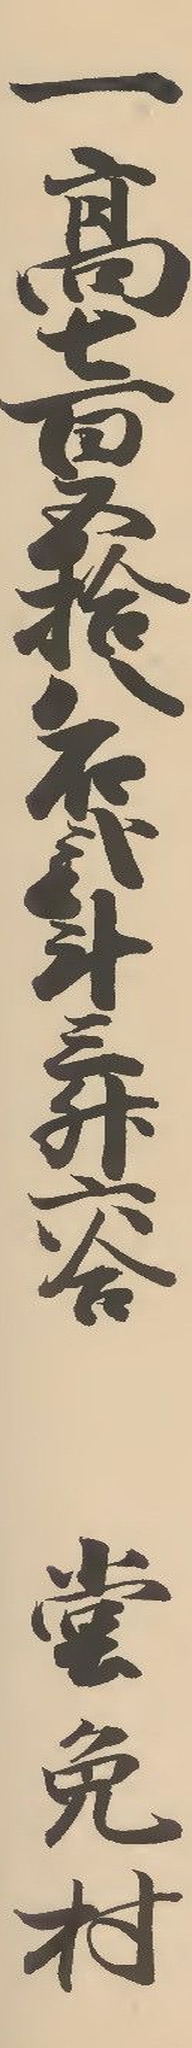一髙七百五拾八石弐斗三升六合堂免村
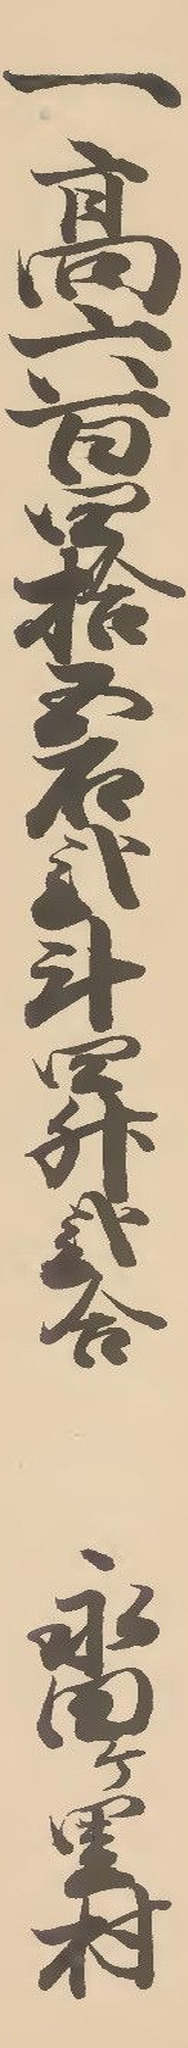一髙六百四拾五石弐斗四升壱合永田ケ里村
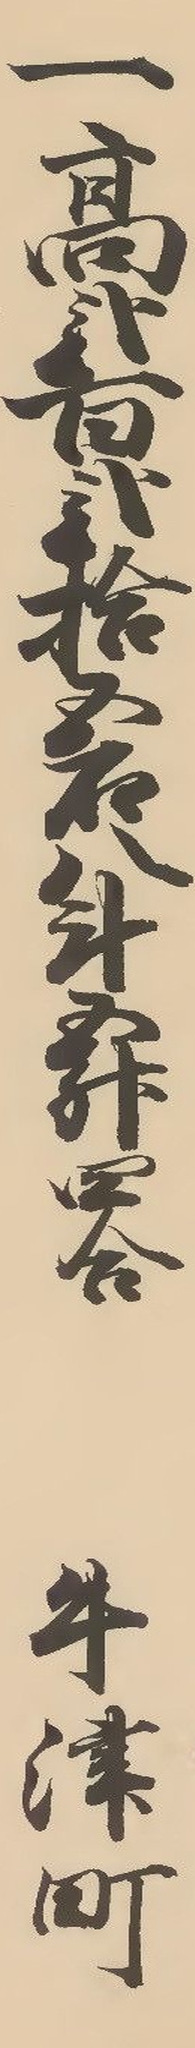一髙弐百弐拾五石八斗五升四合牛津町
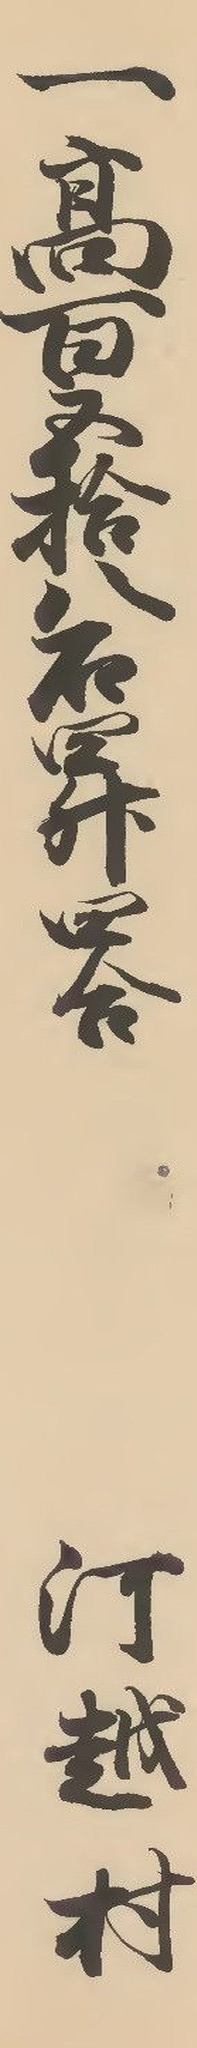一髙百五拾八石四升四合河越村
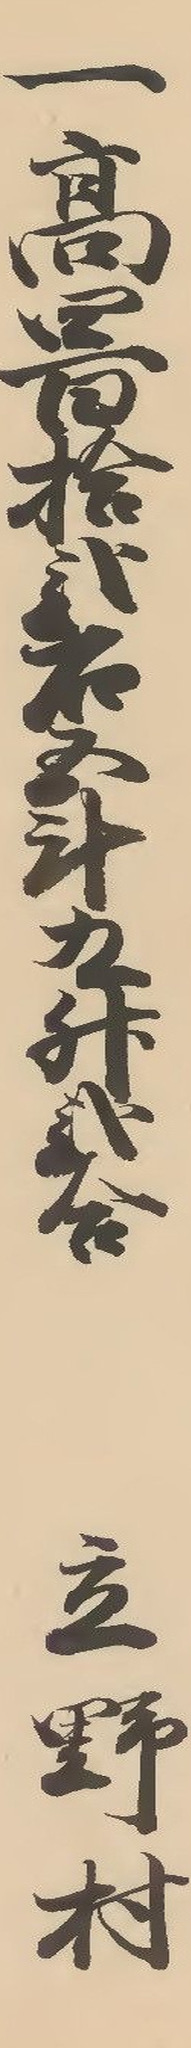一髙四百拾弐石五斗九升弐合立野村

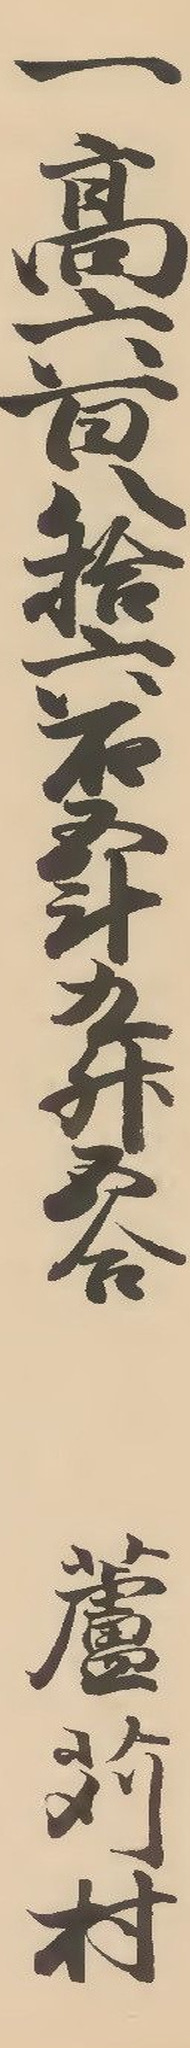一髙六百八拾六石五斗九升五合蘆苅村
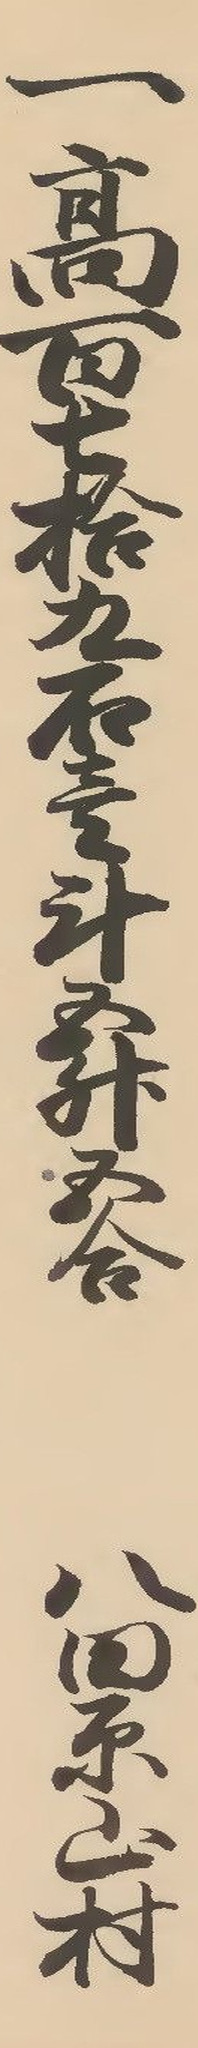一髙百七拾九石壱斗五升五合八田原山村
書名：肥前国郷帳
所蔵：国立公文書館 National Archives of Japan
